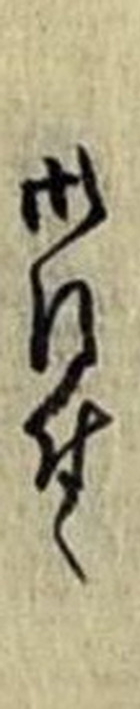御目付へ
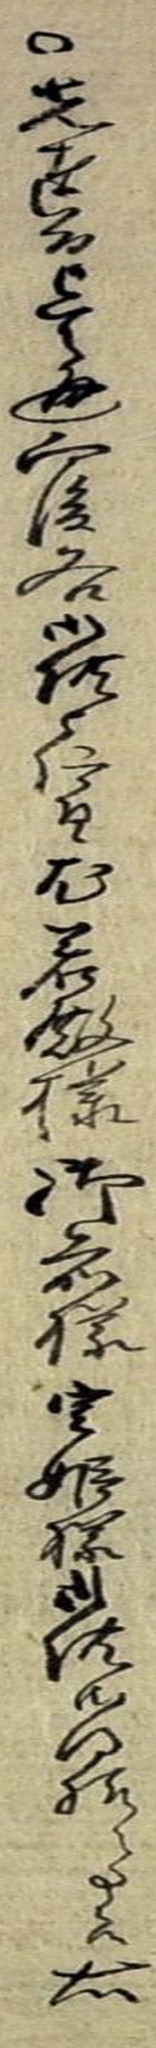○先達而迄之通向後各御供被仰付候尤若殿様御前様定姫様御供御同様之事ニ候右
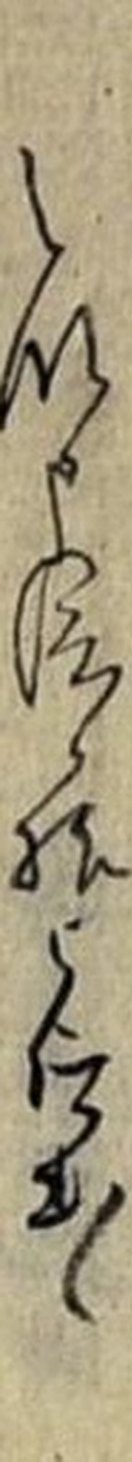之段申渡候様被仰出候
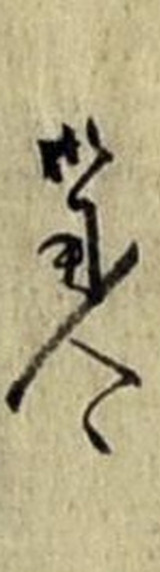御用人へ
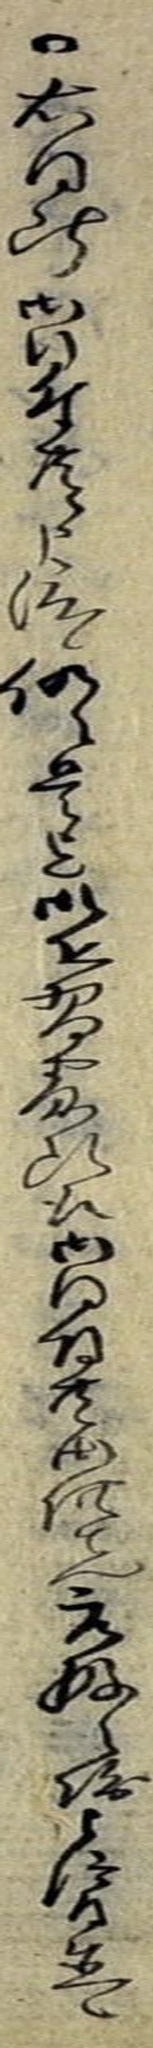○右同断御目付共へ申渡候仍之是迄御近習番頭取御目付共へ御供先取扱之儀被仰付置候
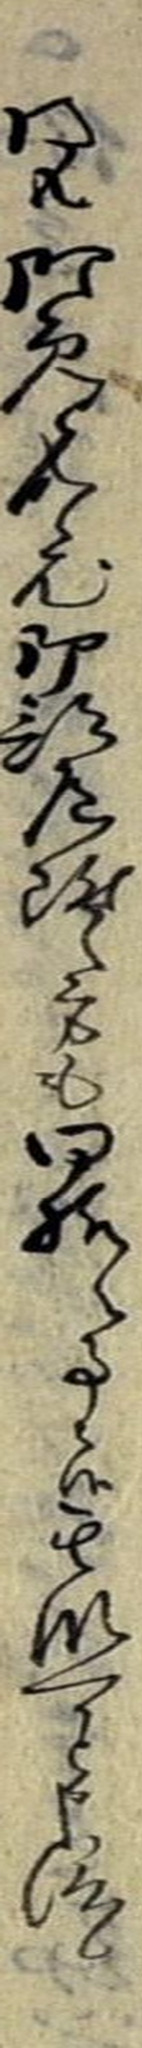得共御免被成候尤御部屋附之方も同様之事ニ候其段可被申渡候
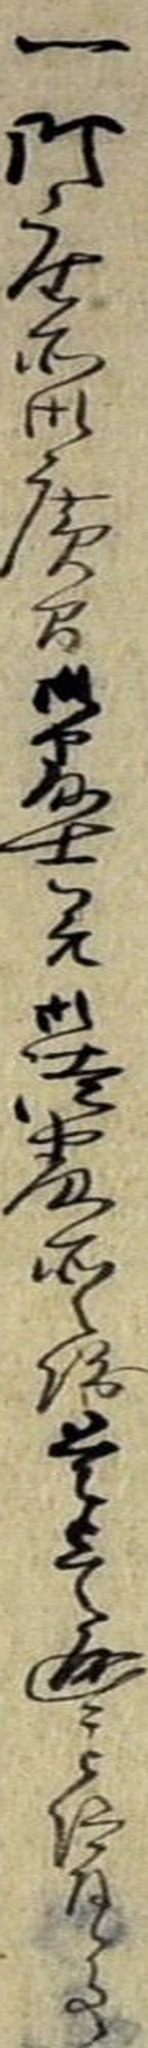一御座所御広間御番士并御徒番所之儀是迄之通被仰付候事
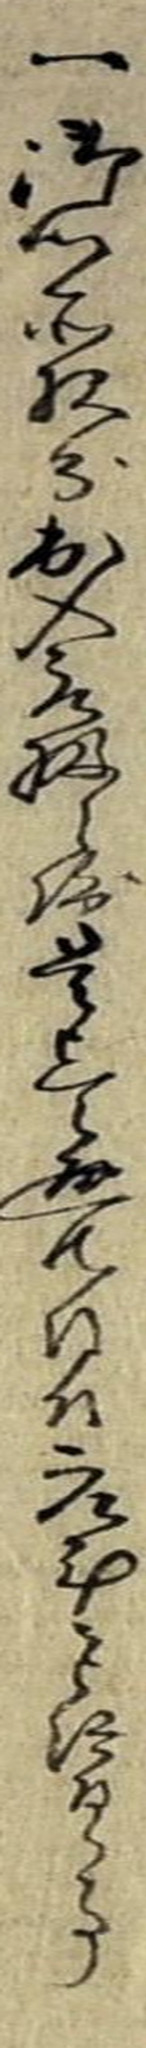一御門所夜分出入取扱之儀是迄之通御目付取計ニ被仰付候事
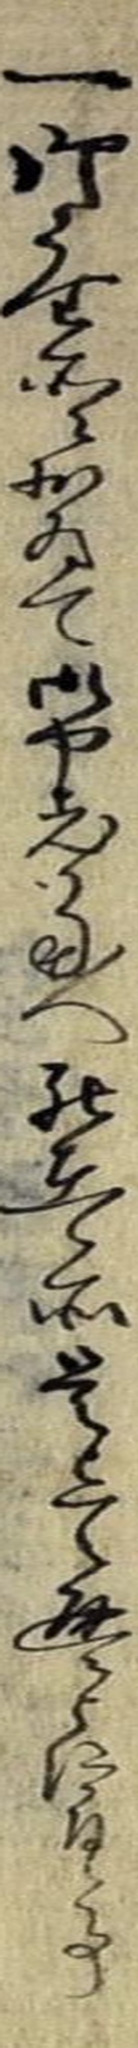一御座所ニおゐて御中老御用人罷在候所是迄之通ニ被仰付候事
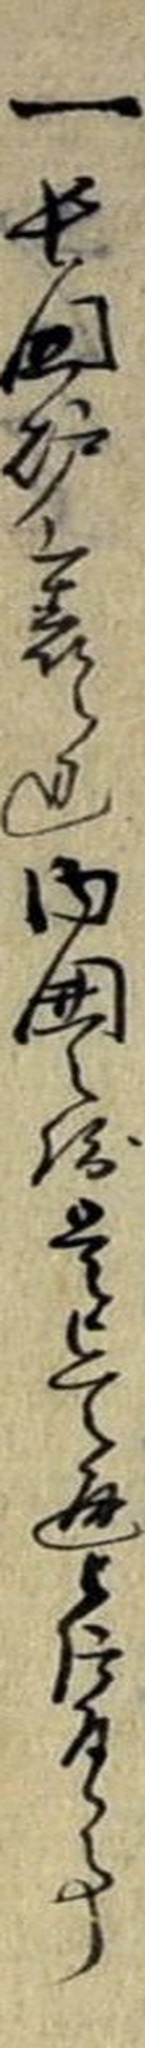一長囲炉裏之辺内囲之儀是迄之通被仰付候事
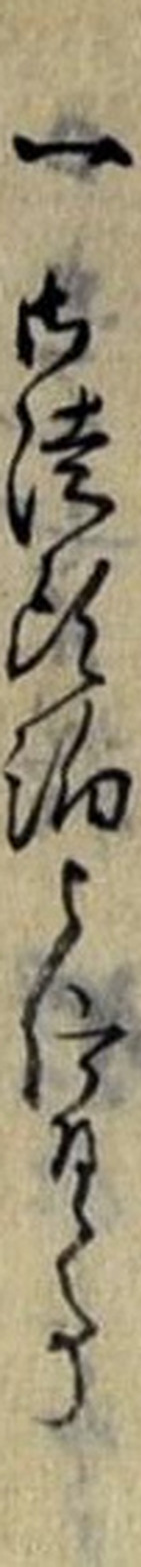一御徒頭泊被仰付候事
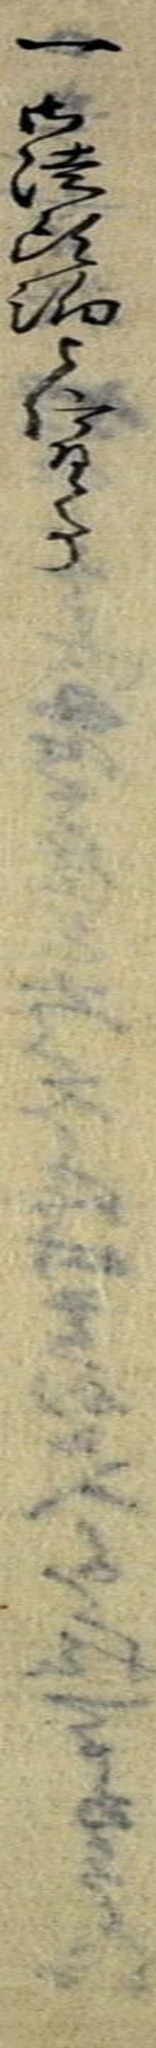一御徒頭泊被仰付候事
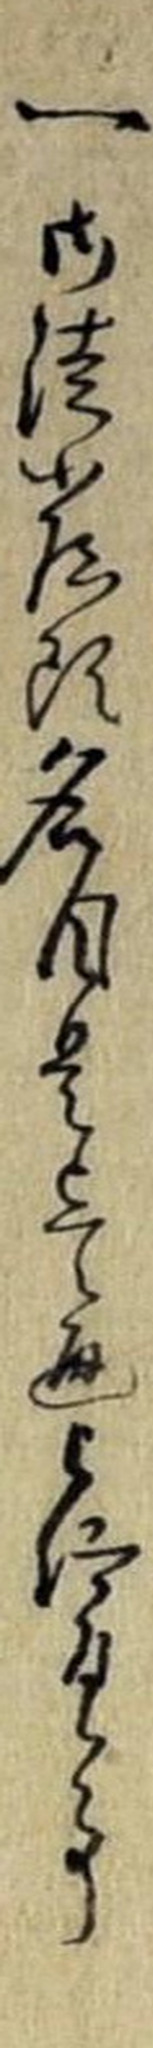一御徒小屋頭名目是迄之通被仰付候事
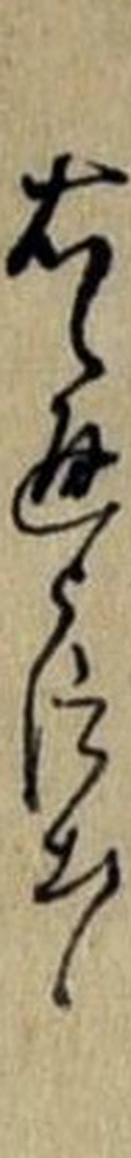右之通被仰出候
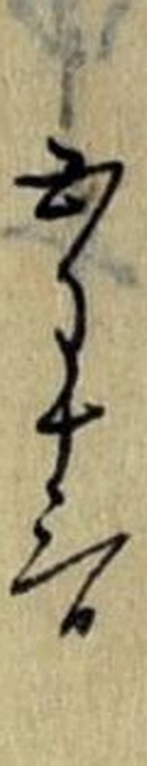五月十三日
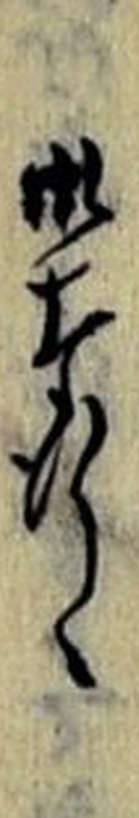御奉行へ
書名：命令之部 三
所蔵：福井県文書館 Fukui Prefectural Archives
